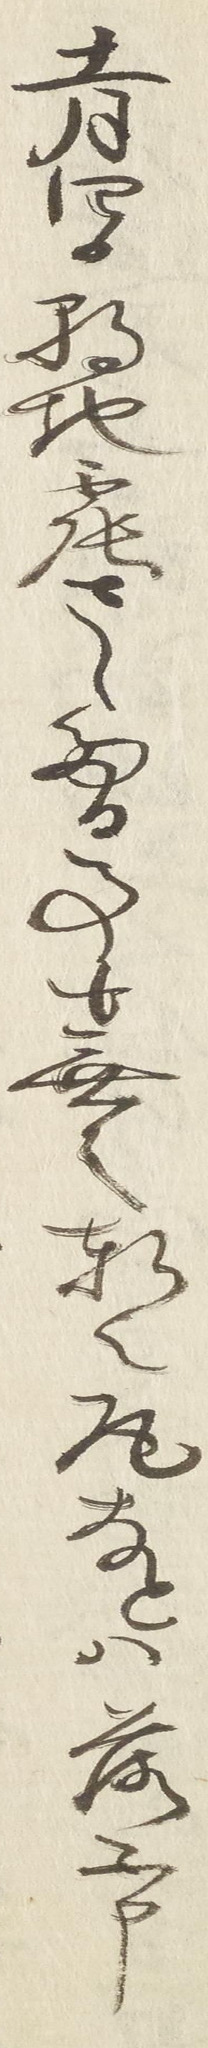十一月四日朝地震さしたる事も無之軒之瓦なとは落不申
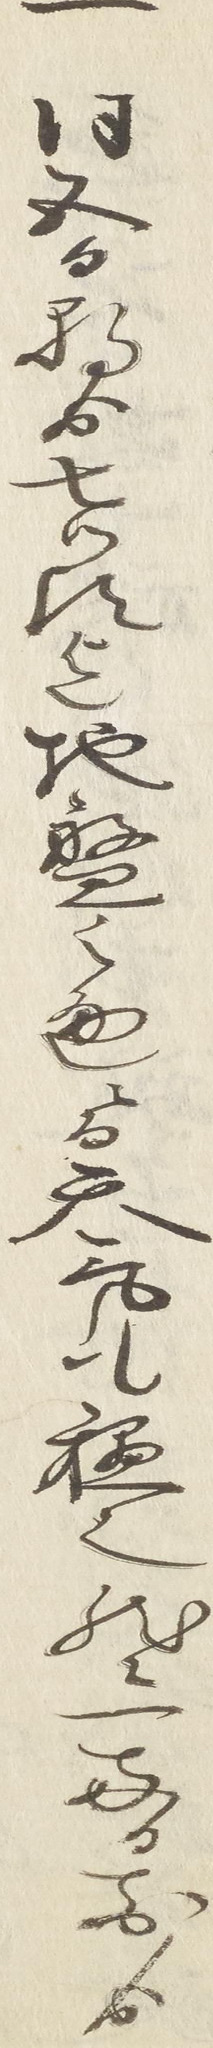一同五日朝ゟ七ッ頃迄地盤之通二而天気も穏也然に一両日前ゟ
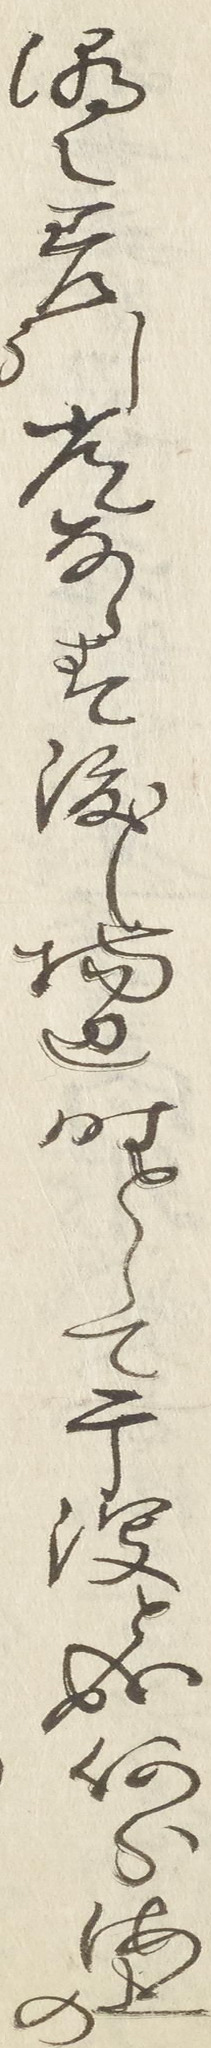潮之差引常ならす渡し場辺時として干潟と成何分海上の
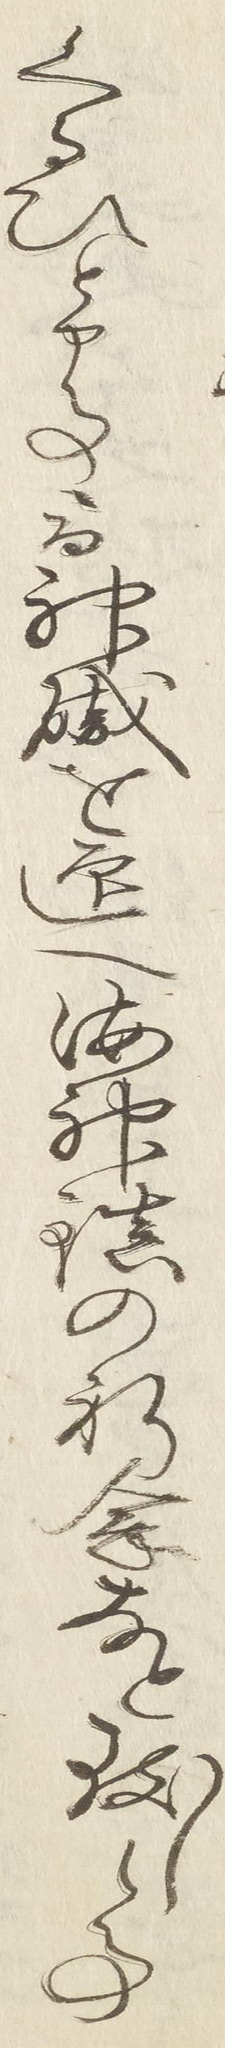くるひと申事二而神職を迎へ海神鎮の祈念なと致し候事
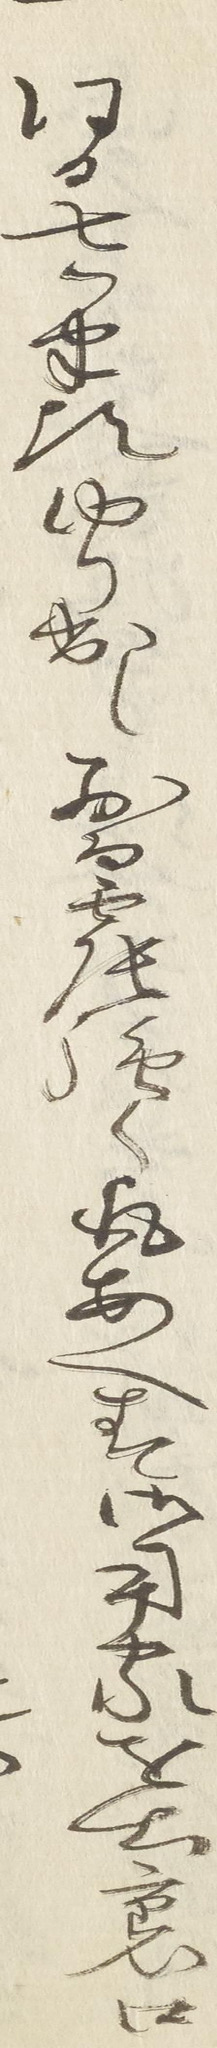一同日七ッ半頃ゆり出し至而震強く取あへす御用家を出裏口
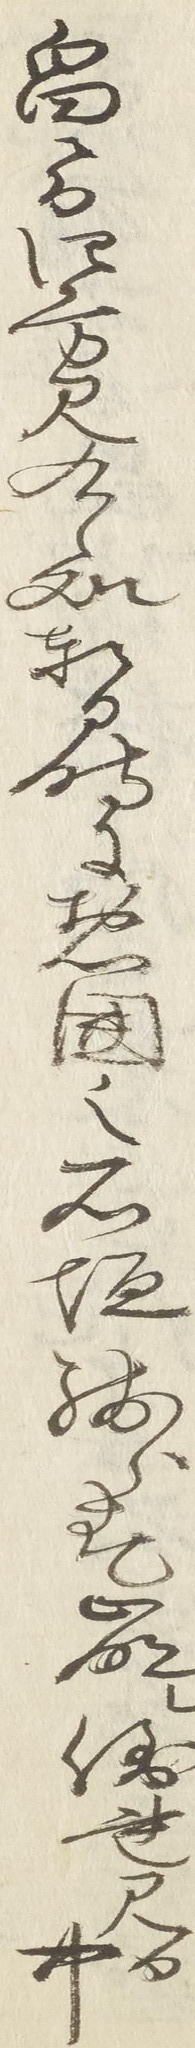畠二而四方見及候処朝日時に惣囲之石垣残らす崩ㇾ倒れ見る中
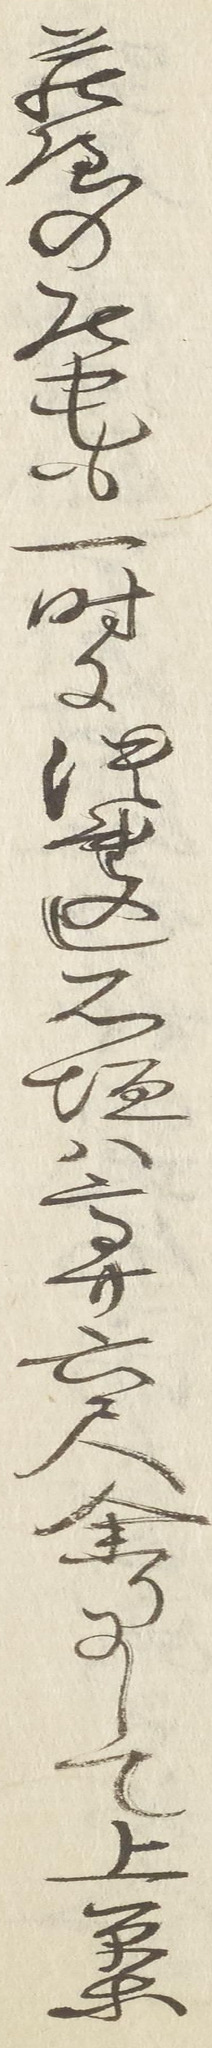庄屋の居宅も一時に潰れ込石垣は高さ六尺余りにして上柔ら
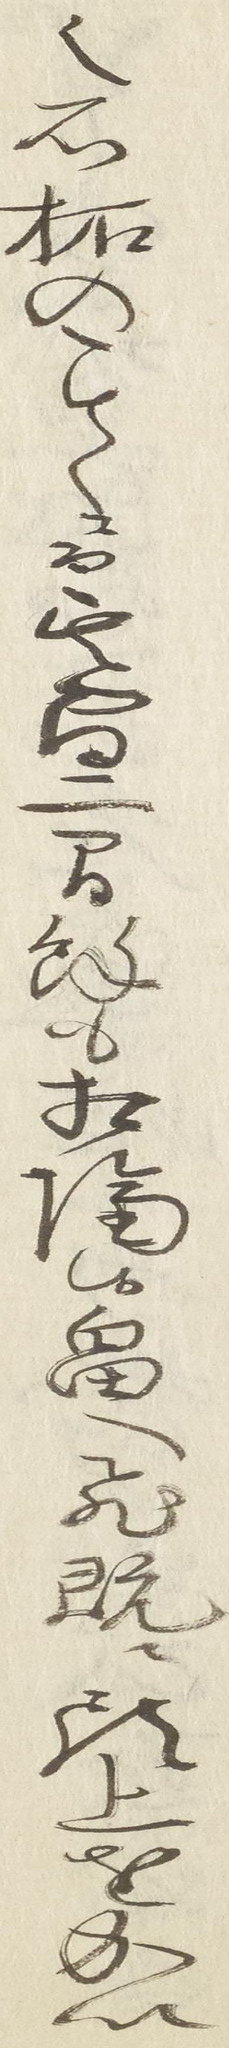之石柘のことく二而其間二間餘も相隔候畠へ飛既に頭上をかい
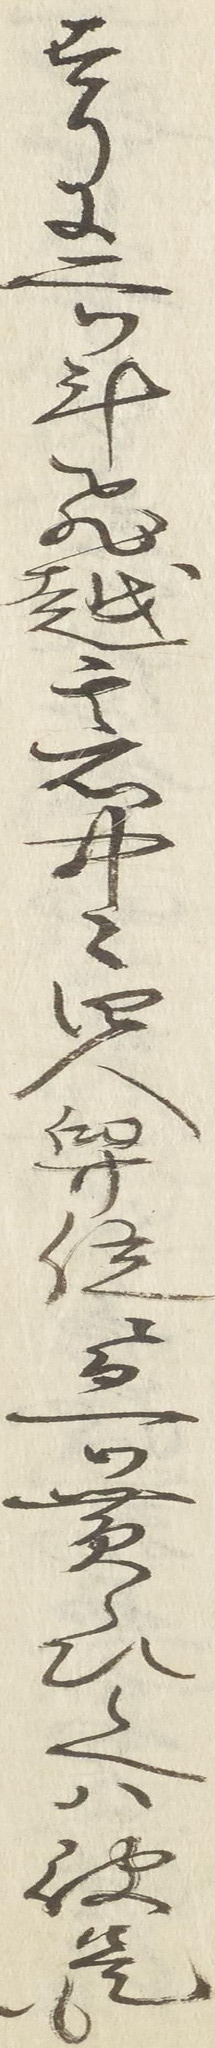そうに二ッ斗飛越其石中々四人舁位二而一ッ貰らひ候へば彼是も
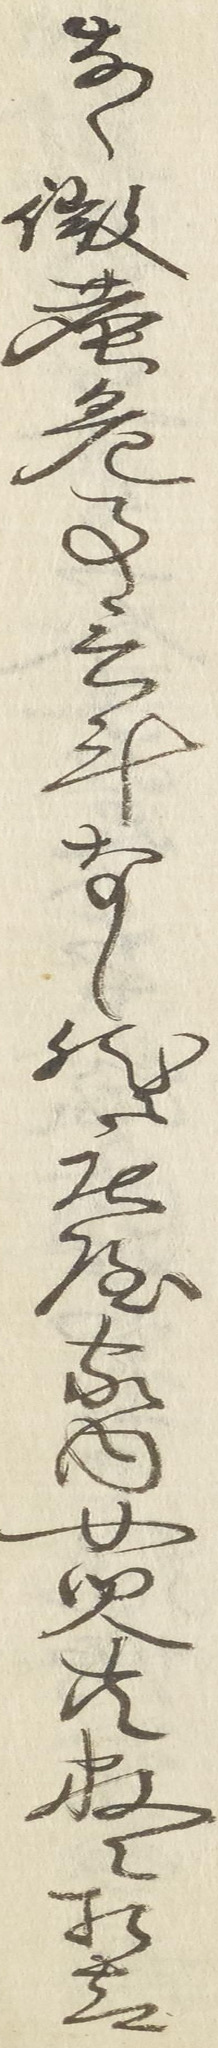なく微塵危事云斗なし然二庄屋家内女児共救候相筈
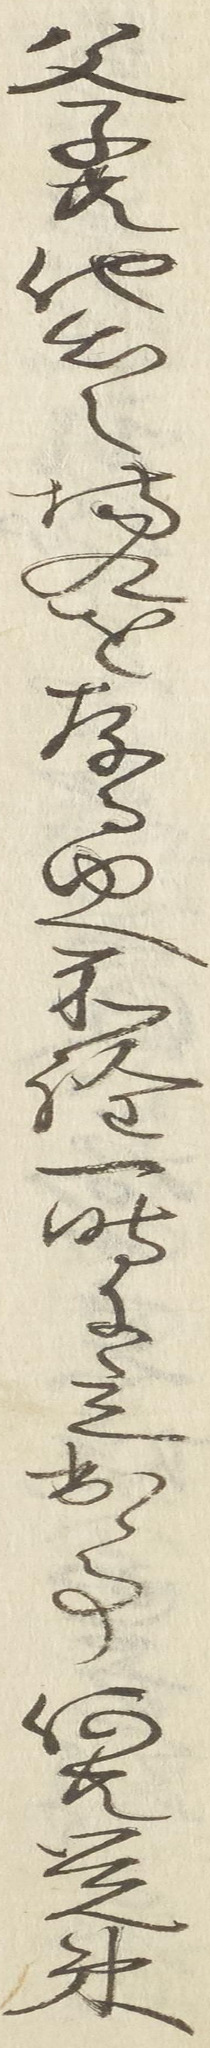父子共他出し場合を存るゆへ所詮一時に立出候事何共覚束

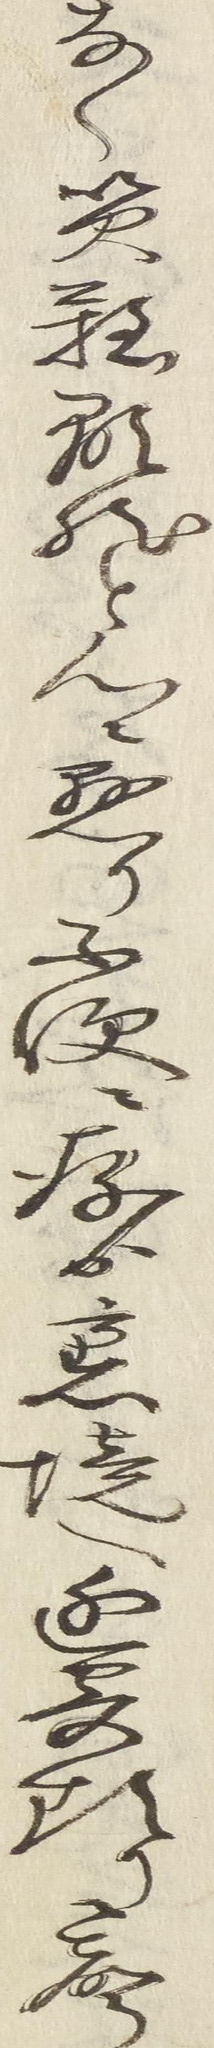なく笑難顕然と心二懸り不便に存ゟ慮境へ逃寄預り声
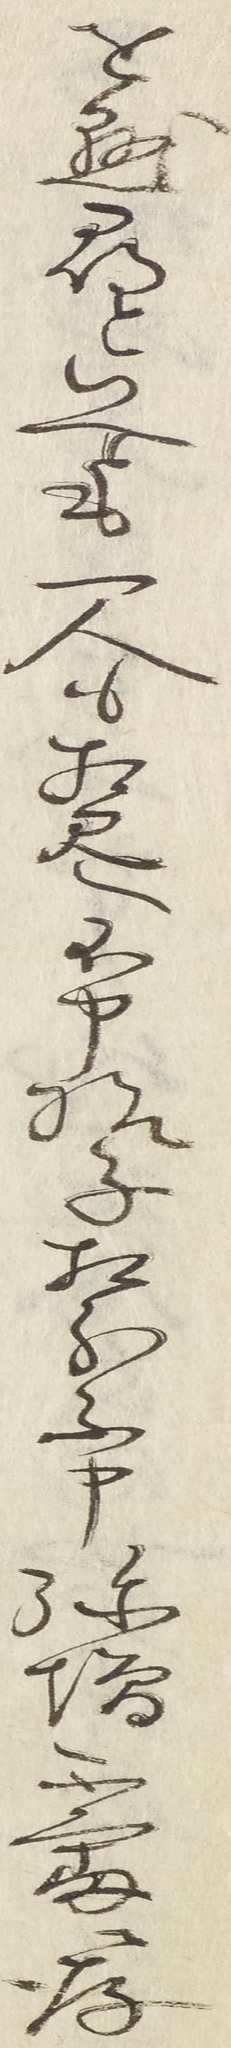を懸尋といへとも一人も相見へ不申様子相分不申弥増不審二存
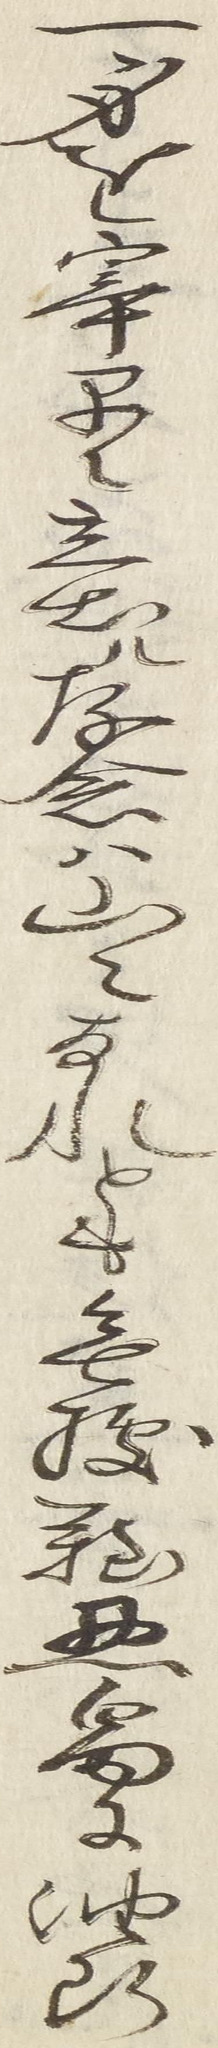一身を宰早々立出ㇽ存念は山々なれども無拠難悪畠に油断
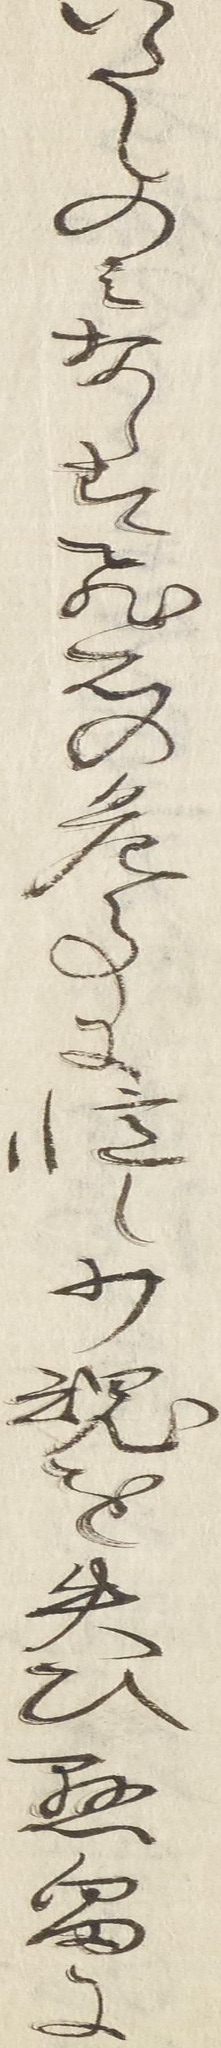いたしのみならす飛石の危事に憶しの魂を失ひ懸畠に
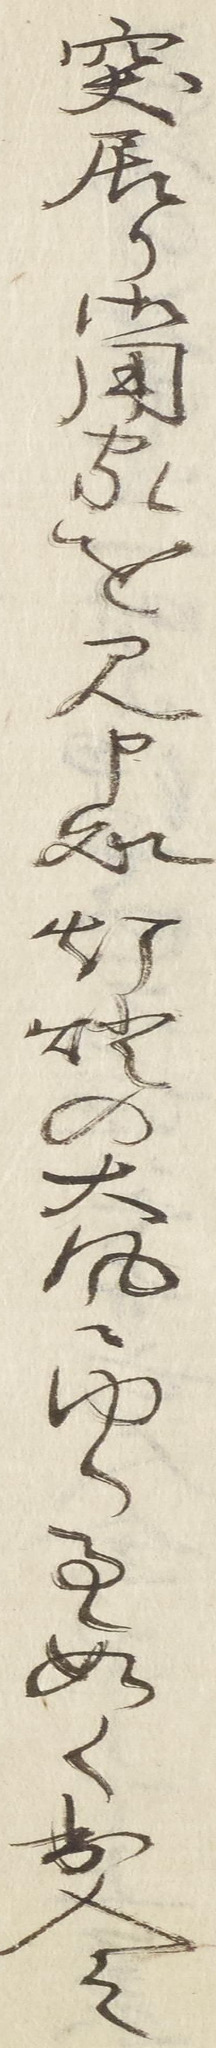突居り御用家を見申処灯燈の大風二ゆらる如く出入之
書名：地震記　下
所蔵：東京大学地震研究所図書室 Earthquake Research Institute Library, The University of Tokyo, JAPAN
